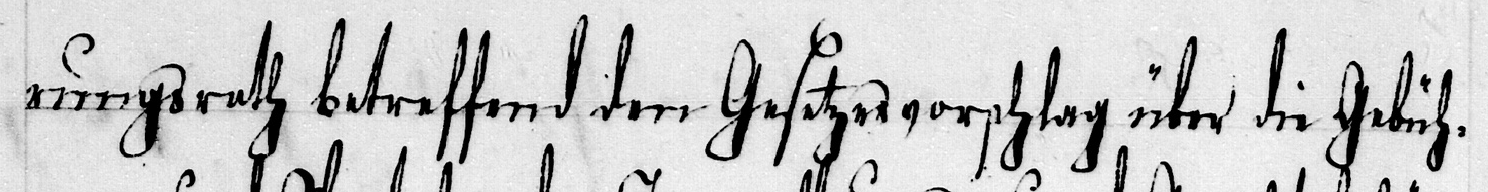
rungsrath betreffend den Gesetzesvorschlag über die Gebüh¬
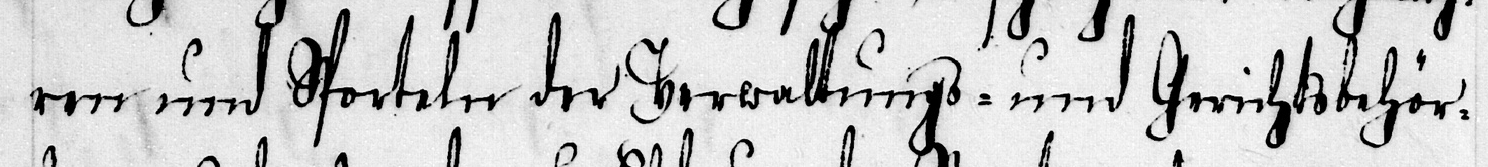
ren und Sporteln der Verwaltungs- und Gerichtsbehör¬
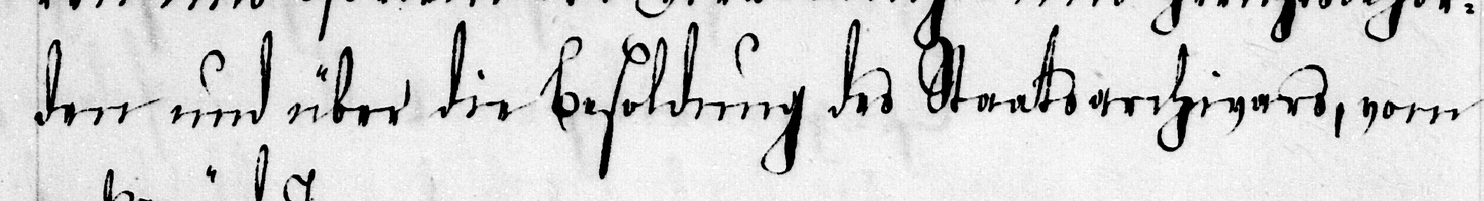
den und über die Besoldung des Staatsarchivars, vom
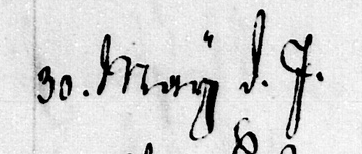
30. May d. J.
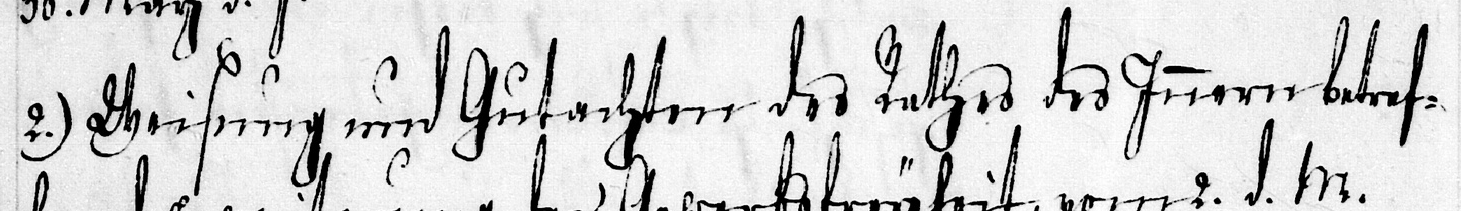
2.) Weisung und Gutachten des Rathes des Innern betre¬
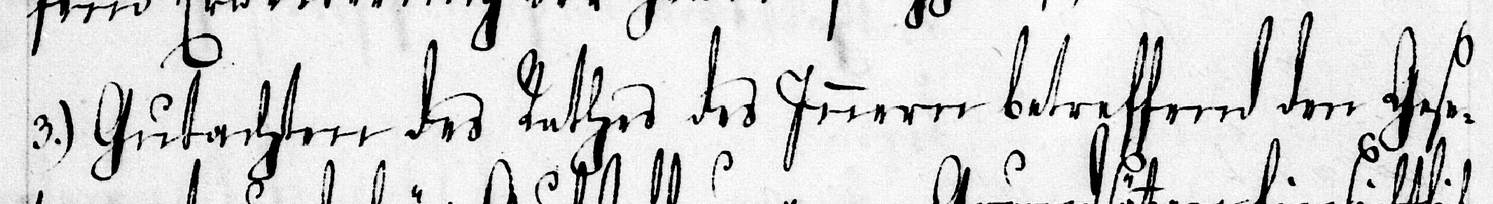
3.) Gutachten des Rathes des Innern betreffend den Gese¬
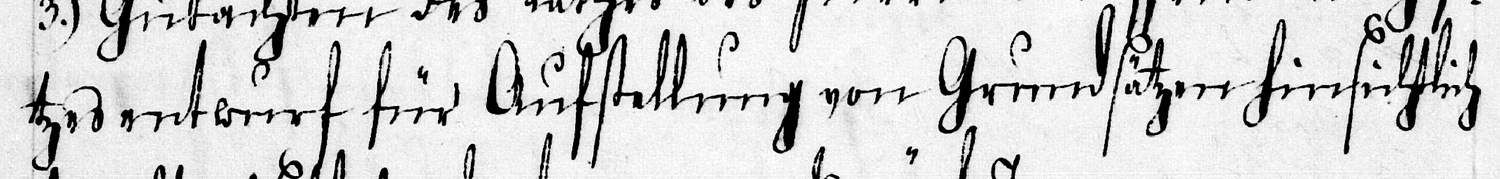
tzesentwurf für Aufstellung von Grundsätzen hinsichtli¬
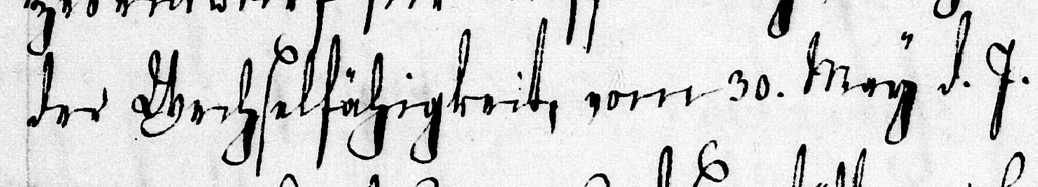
der Wechselfähigkeit, vom 30. May d.
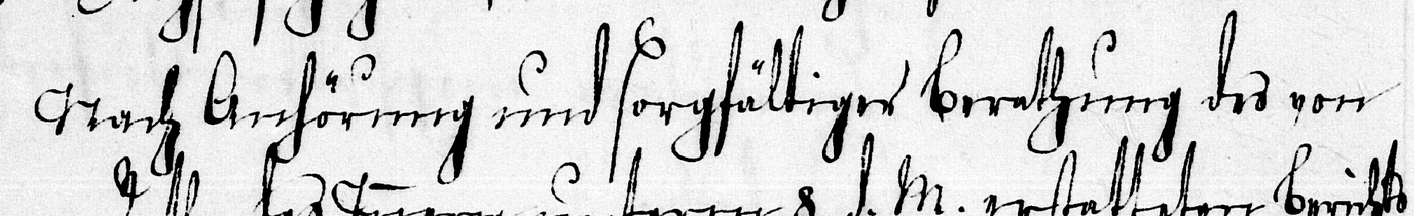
Nach Anhörung und sorgfältiger Berathung des von
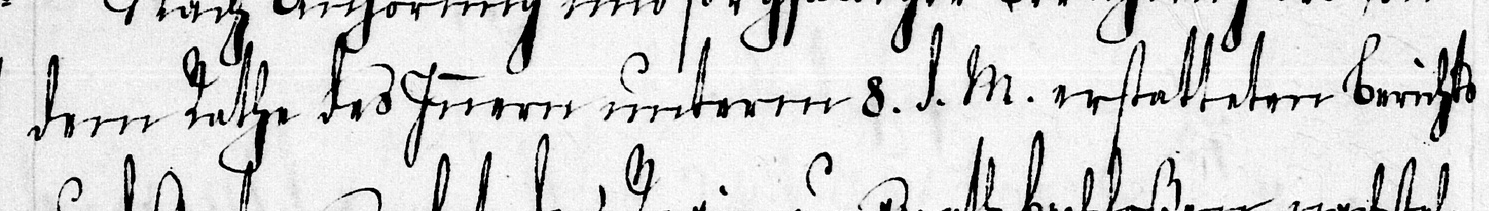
dem Rathe des Innern unterm 8. d. M. erstatteten Berichts
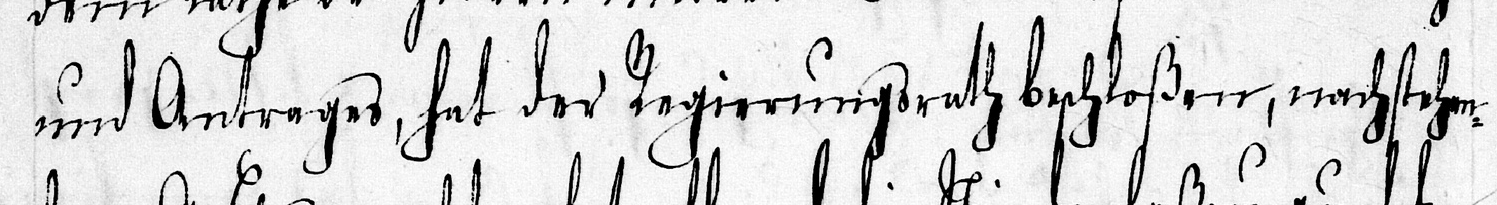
und Antrages, hat der Regierungsrath beschloßen, nachstehe¬
